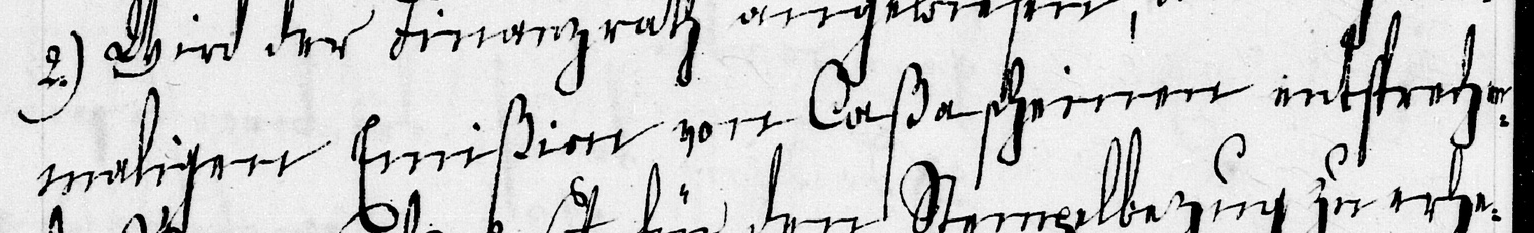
maligen Emißion von Caßascheinen entspreche¬
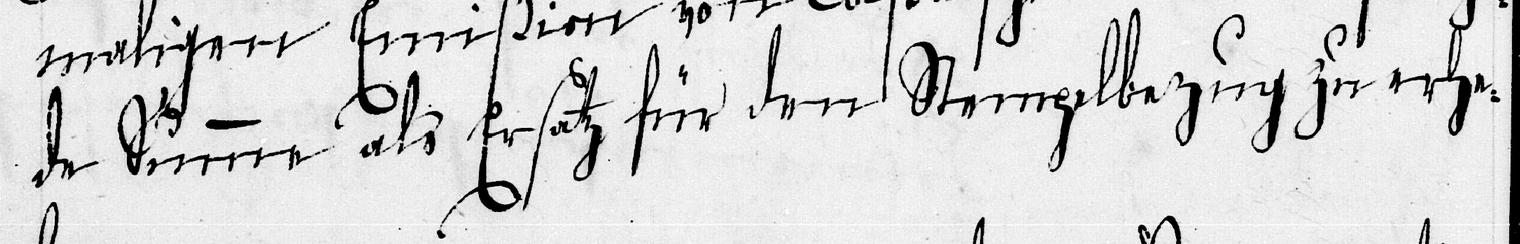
nde Summe als Ersatz für den Stempelbezug zu erhe¬
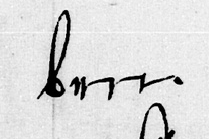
ben.
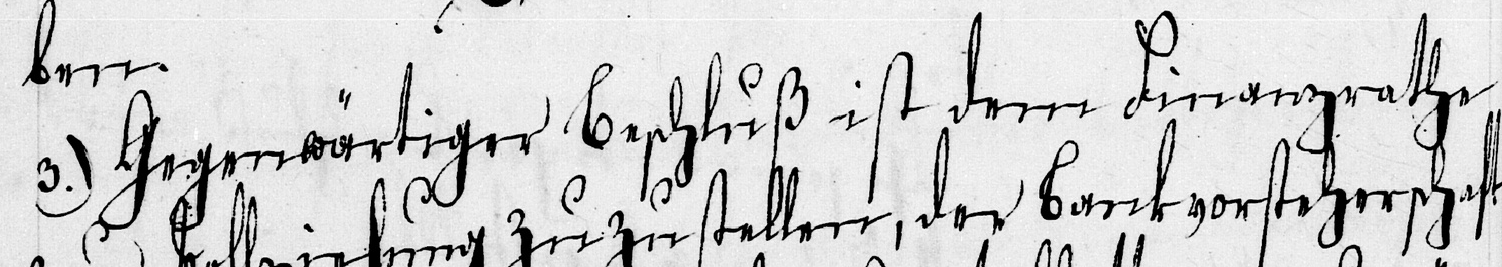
3.) Gegenwärtiger Beschluß ist dem Finanzrathe
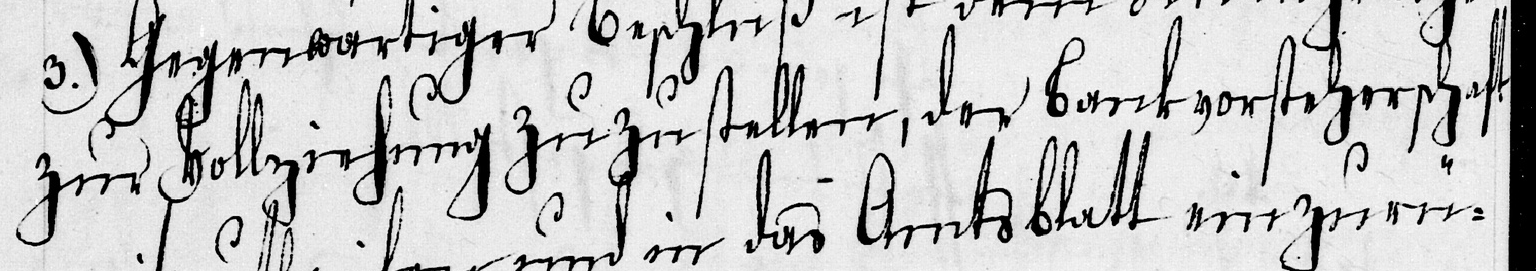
zur Vollziehung zuzustellen, der Bankvorsteherschaft
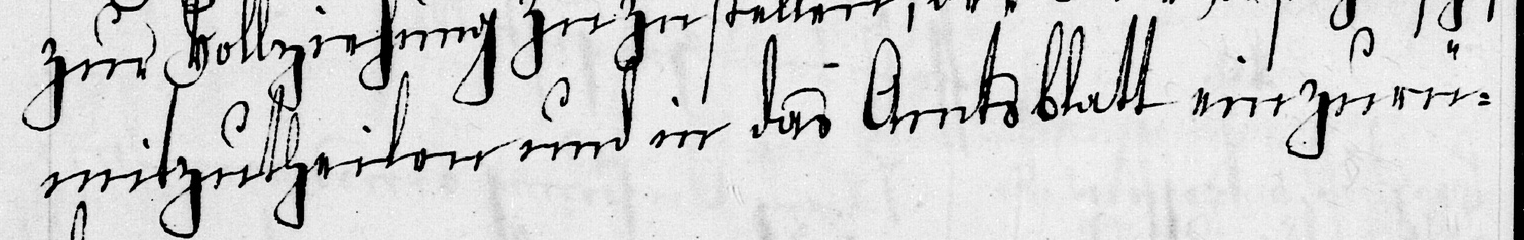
mitzutheilen und in das Amtsblatt einzurü¬
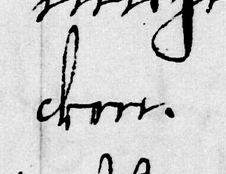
cken.
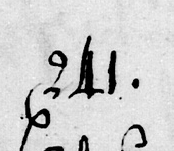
pelgese¬
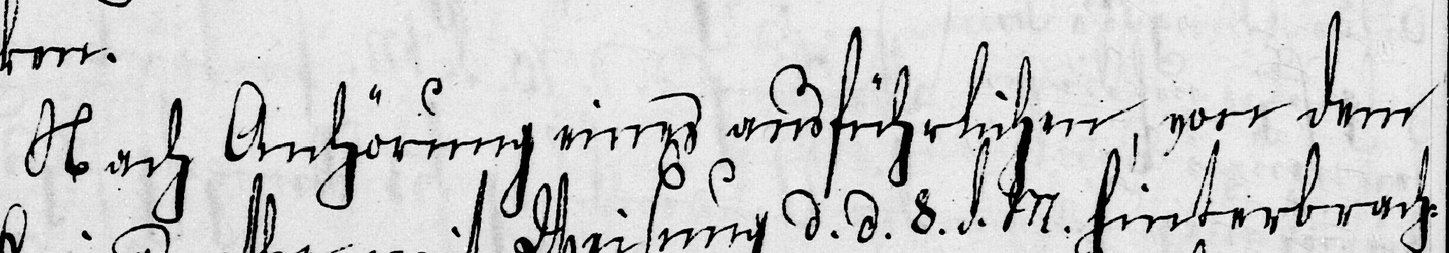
Nach Anhörung eines ausführlichen, von dem
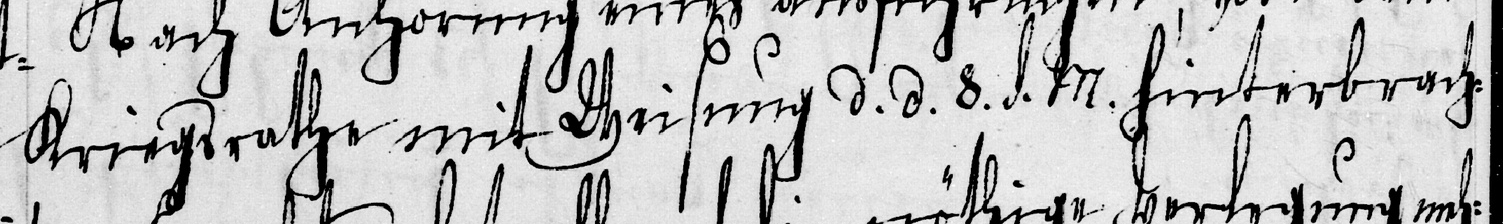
Kriegsrathe mit Weisung d. d. 8. d. M. hinterbrach¬
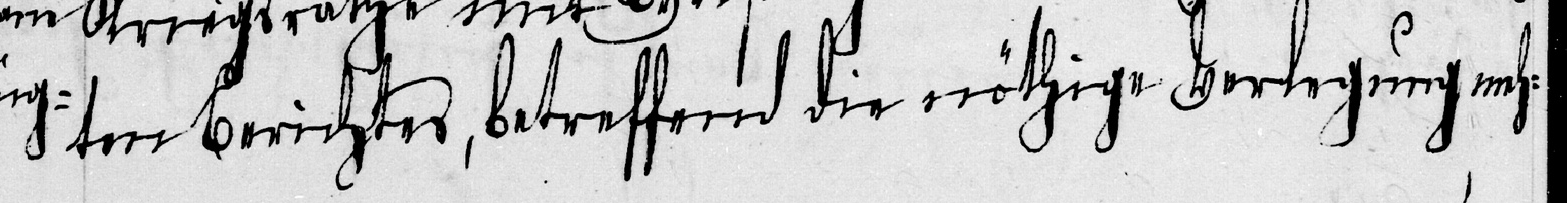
ten Berichtes, betreffend die nöthige Verlegung meh-
